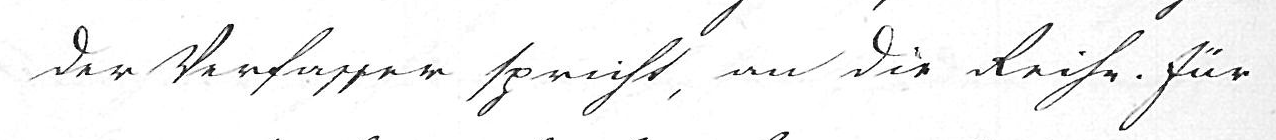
der Verfasser spricht, an die Reihe. Für
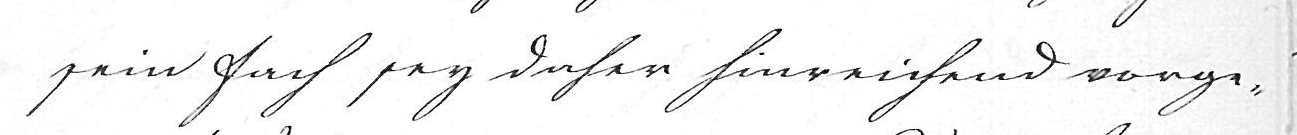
sein fach sey daher hinreichend vorge-
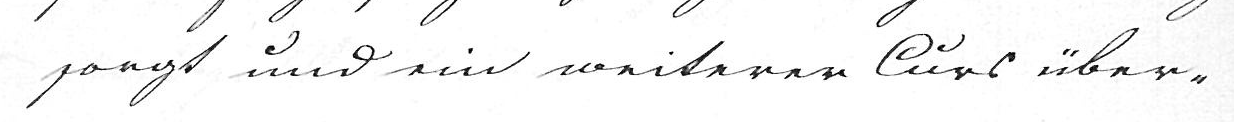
sorgt und ein weiterer Curs über-
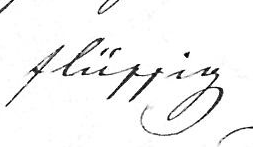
flüsse.
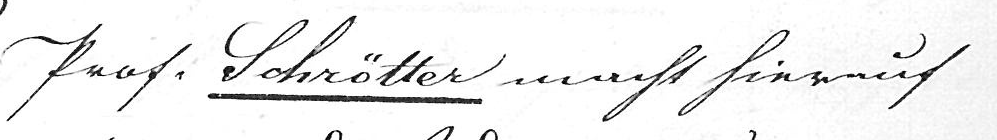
Prof. Schrötter macht hierauf
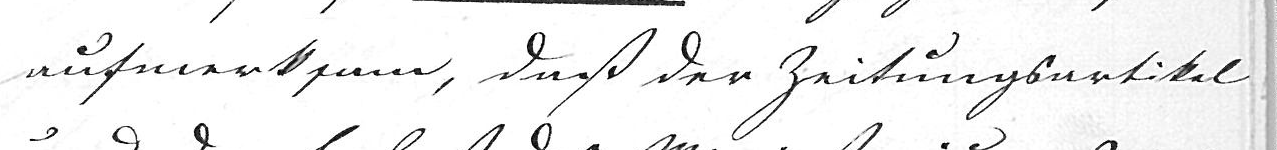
aufmerksam, daß der Zeitungsartikel
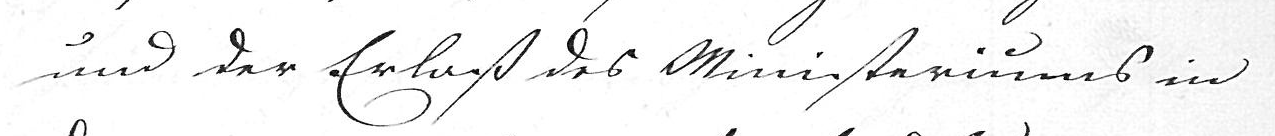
und der Erlaß des Ministeriums in
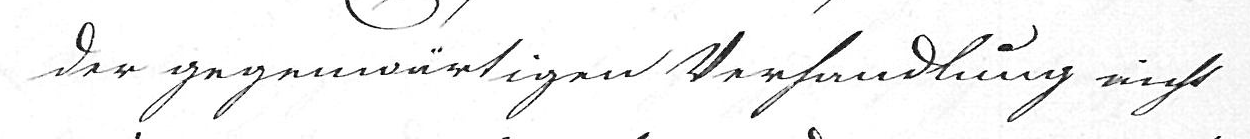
der gegenwärtigen Verhandlung nicht
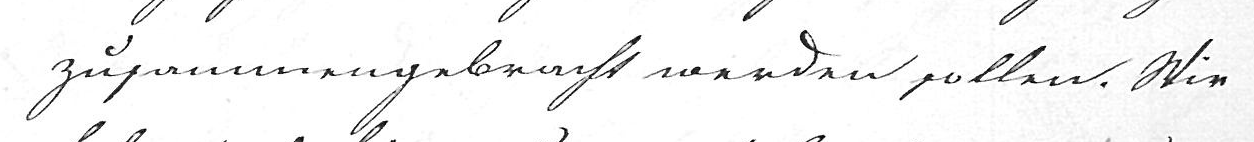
zusammengebracht werden sollen. Wir
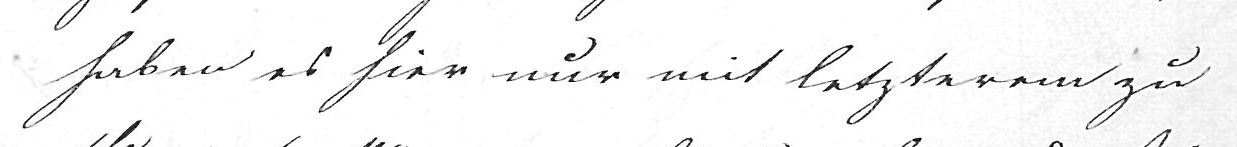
haben es hier nur mit letzterem zu
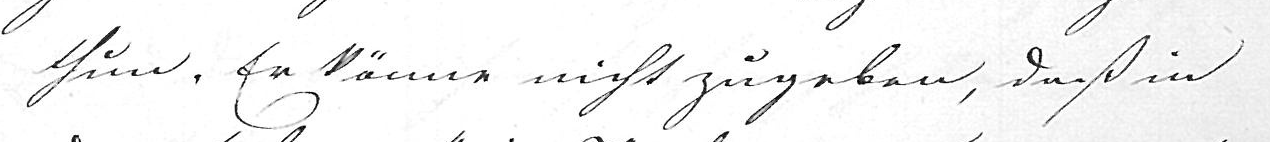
thun. Er könne nicht zugeben, daß in
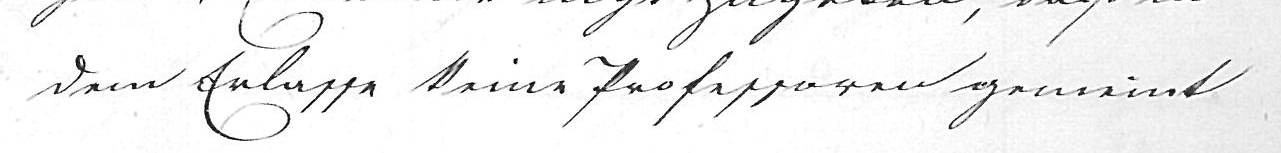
dem Erlasse keine Professoren gemeint
